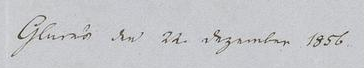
Glarus den 22. Dezember 1856.
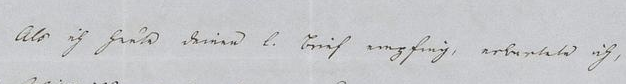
Als ich heute deinen l. Brief empfing, erwartete ich,
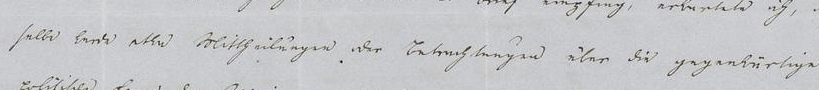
selbe werde etwa Mittheilungen oder Betrachtungen über die gegenwärtige
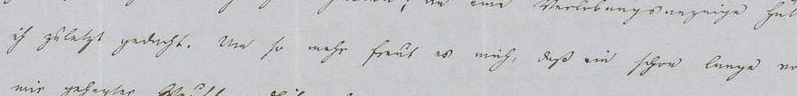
ich zuletzt gedacht. Um so mehr freut es mich, daß ein schon lange von
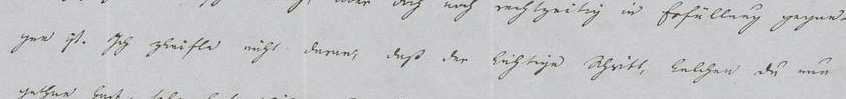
gen ist. ich zweifle nicht daran, daß der wichtige Schritt, welchen Du nun
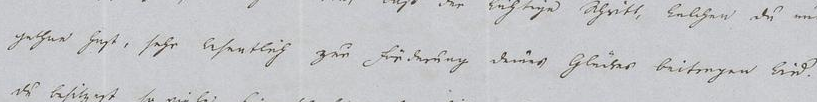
gethan hast, sehr wesentlich zur Förderung Deines Glückes beitragen wird.
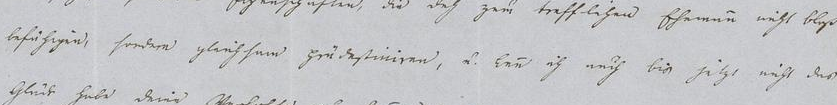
befähigen, sondern gleichsam prädestiniren, u. wenn ich auch bis jetzt nicht das
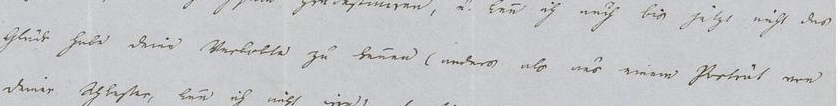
Glück habe Deine Verlobte zu kennen (anders als aus einem Porträt von
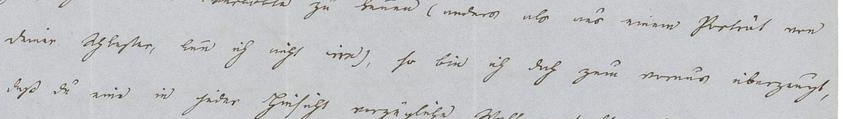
Deiner Schwester, wenn ich nicht irre), so bin ich doch zum voraus überzeugt,
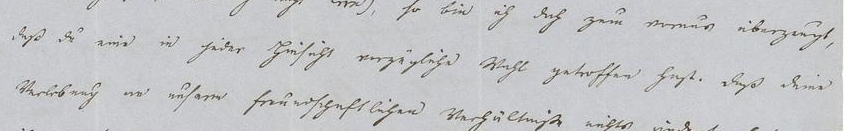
daß Du eine in jeder Hinsicht vorzügliche Wahl getroffen hast. Daß Deine
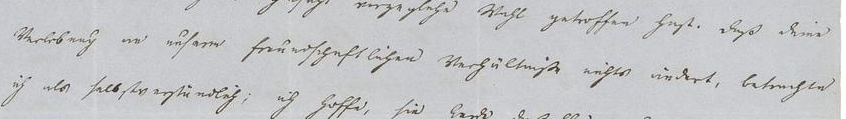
Verlobung an unserm freundschaftlichen Verhältnisse nichts ändert, betrachte
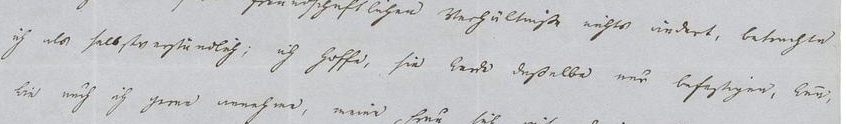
ich als selbstverständlich; ich hoffe, sie werde dasselbe nur befestigen, wenn,
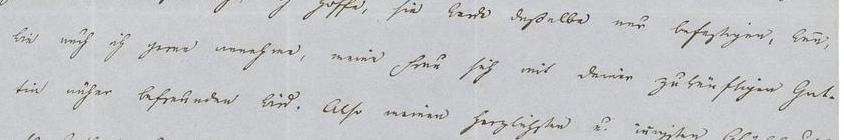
wie auch ich gerne annehme, meine Frau sich mit Deiner zukünftigen Gat-
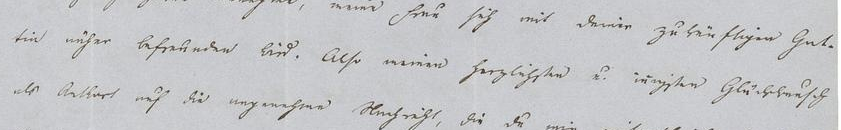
tin näher befreunden wird. Also meinen herzlichsten u. innigsten Glückwunsch
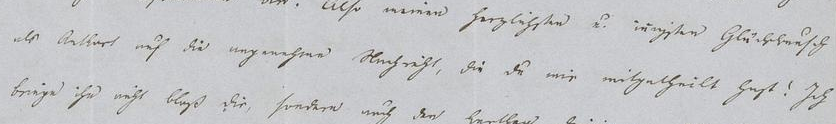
als Antwort auf die angenehme Nachricht, die Du mir mitgetheilt hast! Ich
